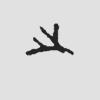出
